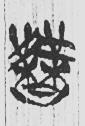{無日}
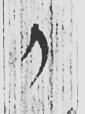人
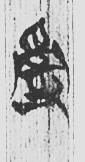𤔔
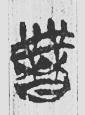{無日}
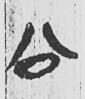公
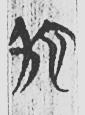{力它}
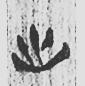出
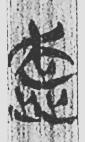奔
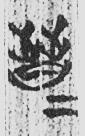晉=
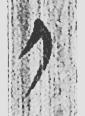人
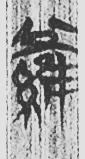羅
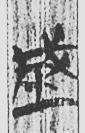城
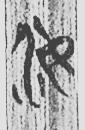汝
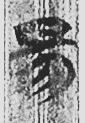昜
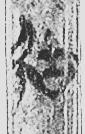居
